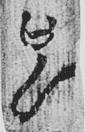也
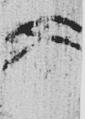不
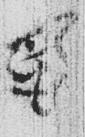○（敏）
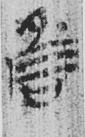唯（雖）
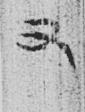又（有）
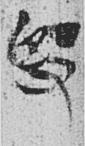○（賢）
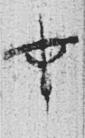才
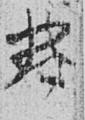弗
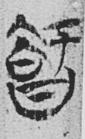○（知）
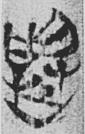○（舉）
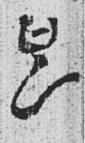也
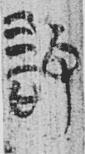敢
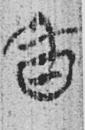昏（問）
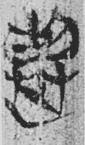○（舉）
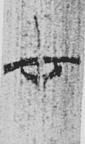才
